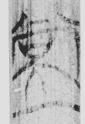堂（當）
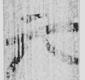亓（其）
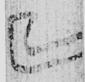曲
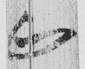㠯（以）
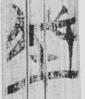城（成）
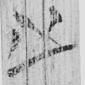之
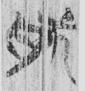肰（然）
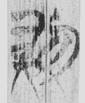則
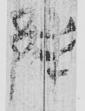邦
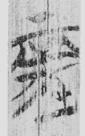塝（平）
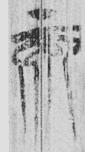而
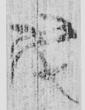民
